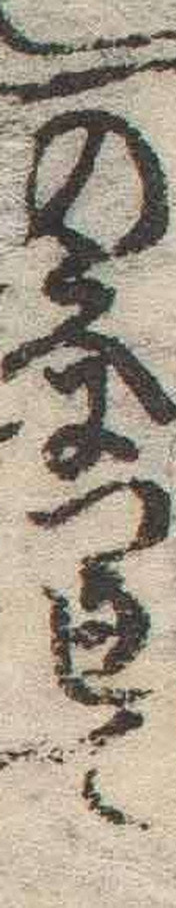の元につうじて
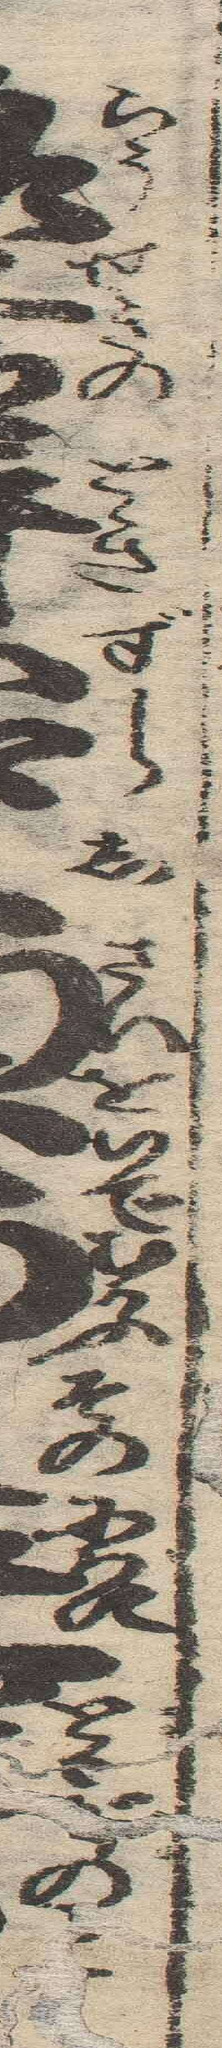らうせきのときずしらしさいをいでむかふそのにわにともがらのこと
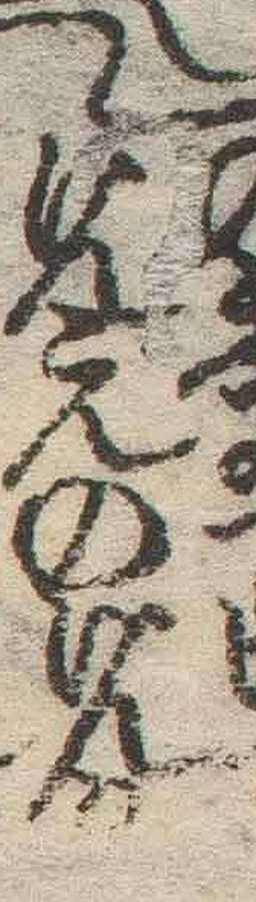けんこんのけんか
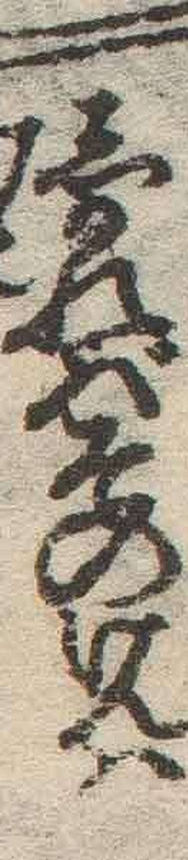しかればそのけんは
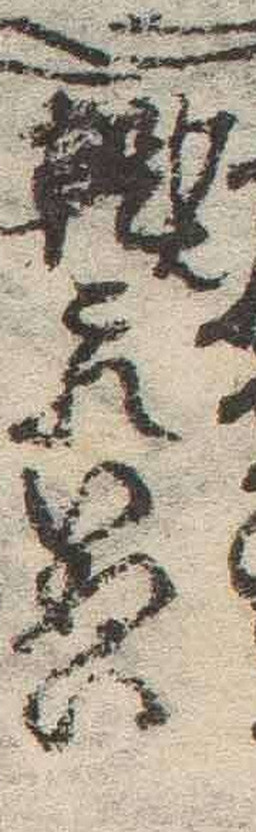乾これいぬい
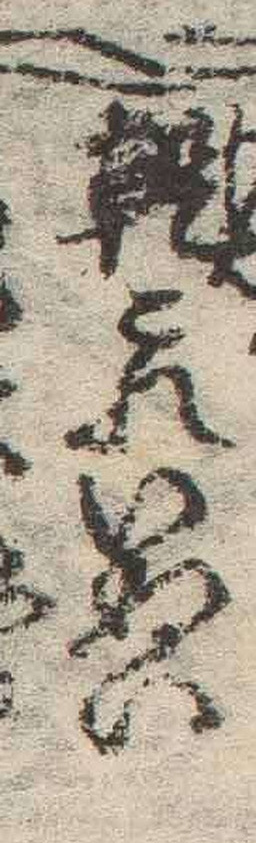乾これいぬい
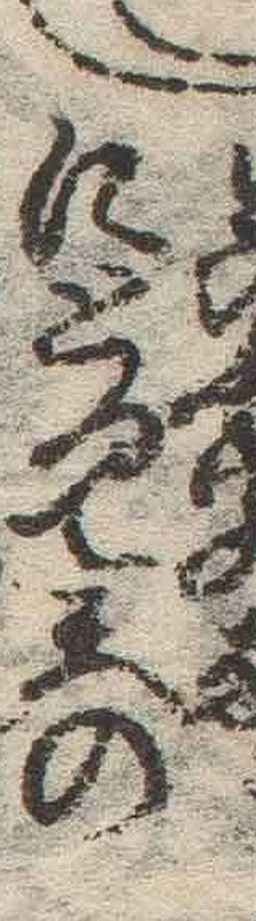にとつて天の
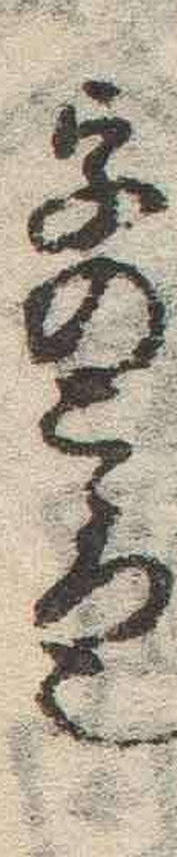字のこゝろ也
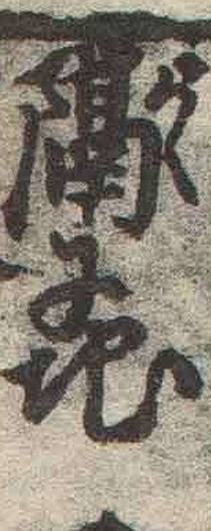隔に地
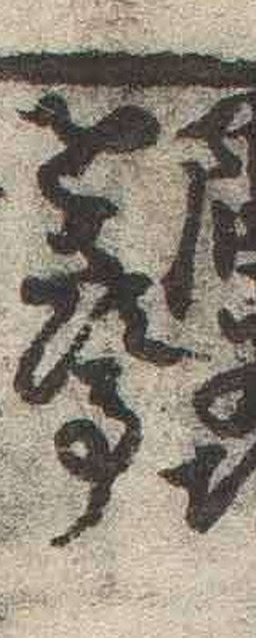をさす事
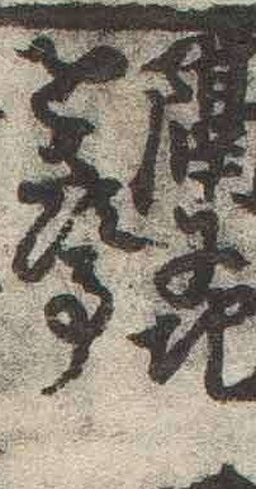をさす事
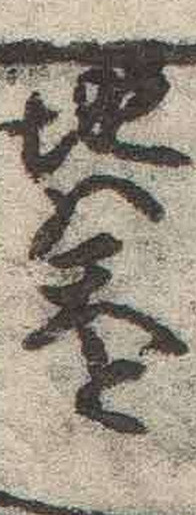地は天と
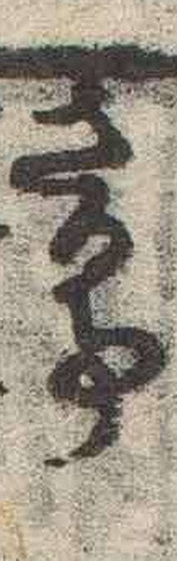さる事
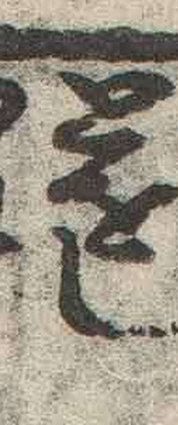とをし
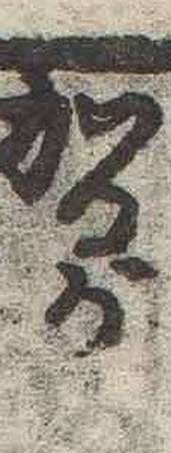かるが
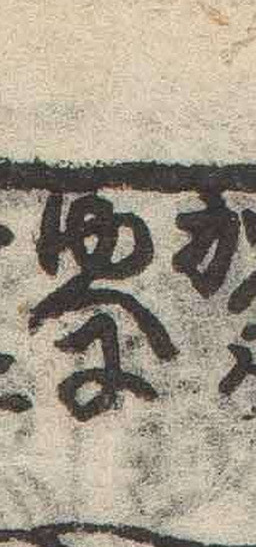ゆへに
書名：御成敗式目絵抄
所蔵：東京学芸大学附属図書館 国文学研究資料館
